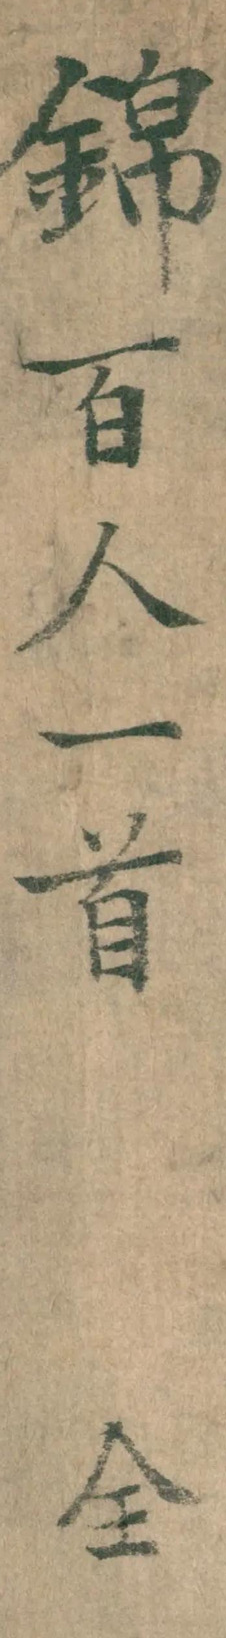錦百人一首全

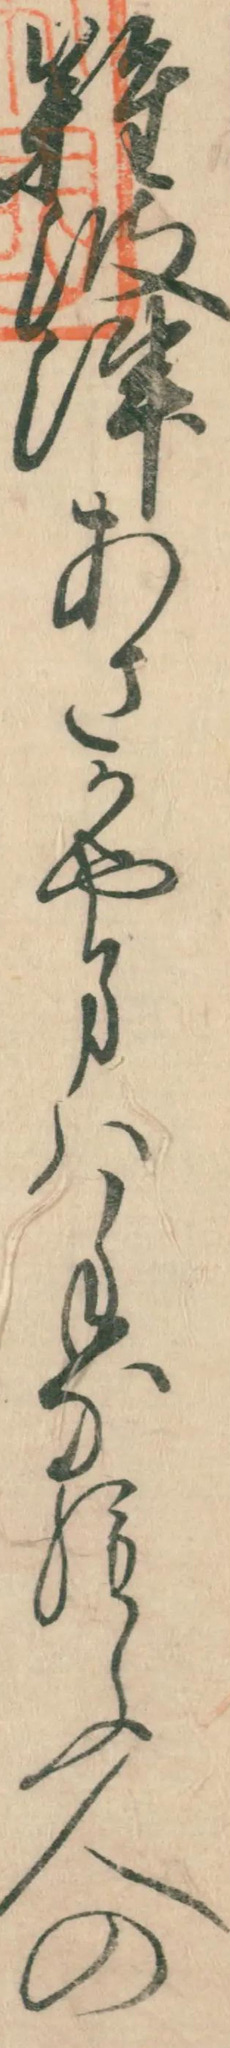難波津あさかやまは手ならふ人の
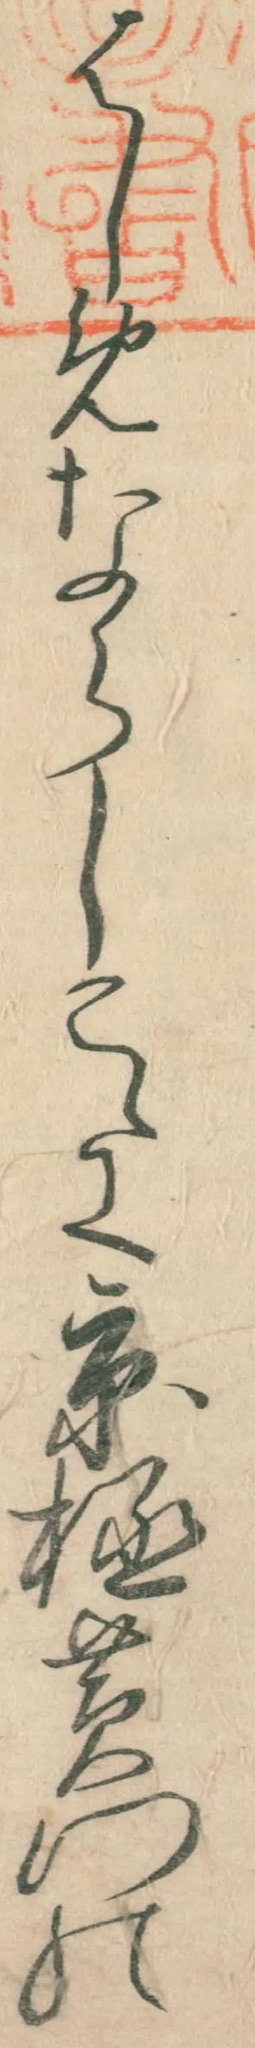はしめならしこゝに京極黄門の
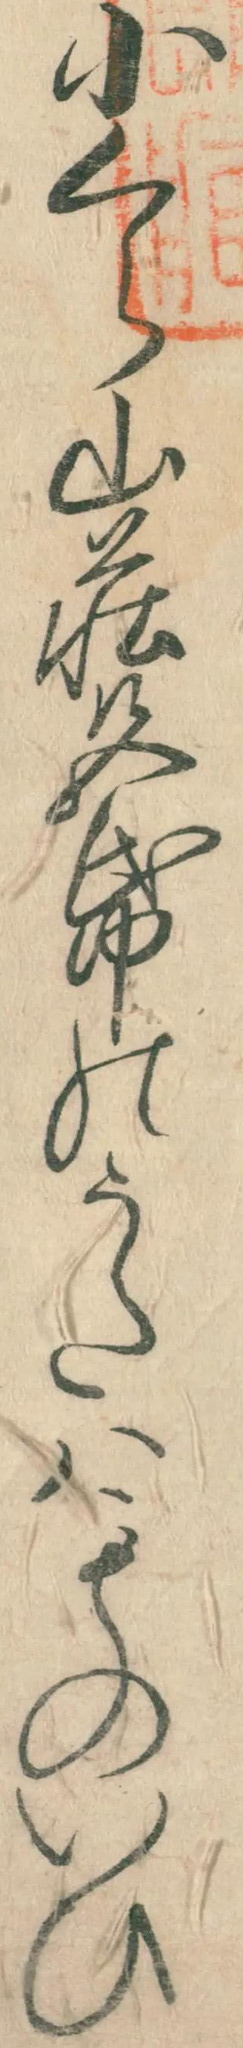小くら山荘色紙のうたはものいひ
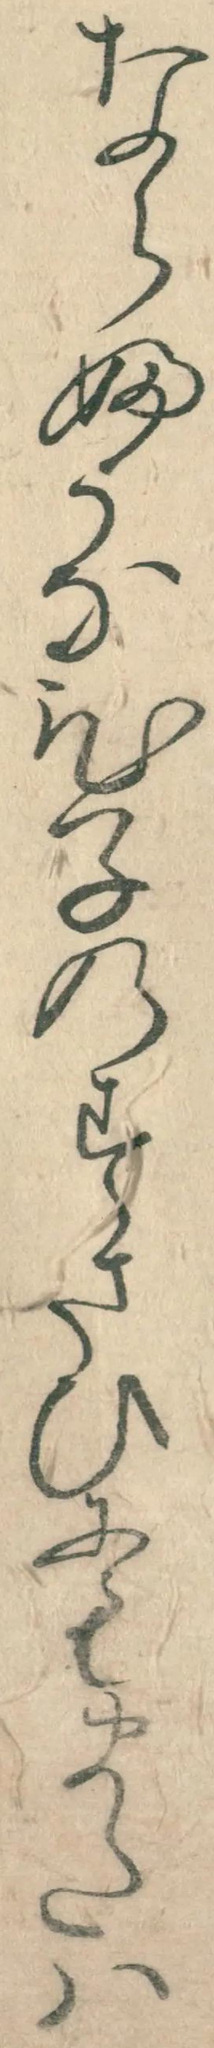ならふうなひ子のすさひにもまたは
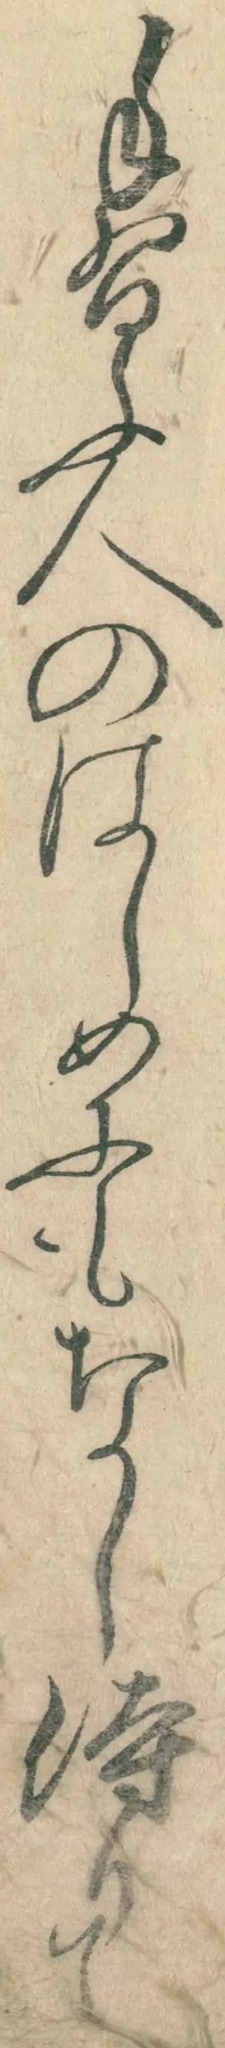手習ふ人のはしめにもなし侍りて
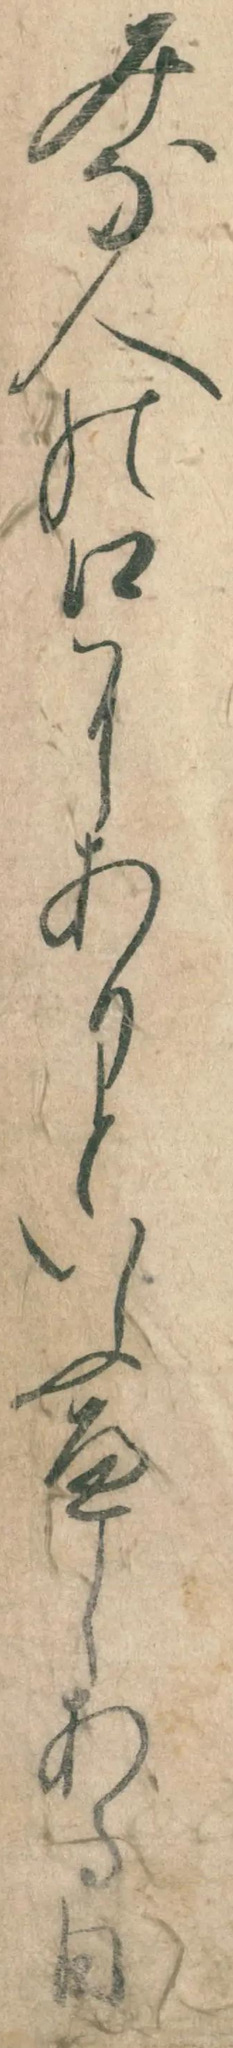みな人の口にありといふへしある日

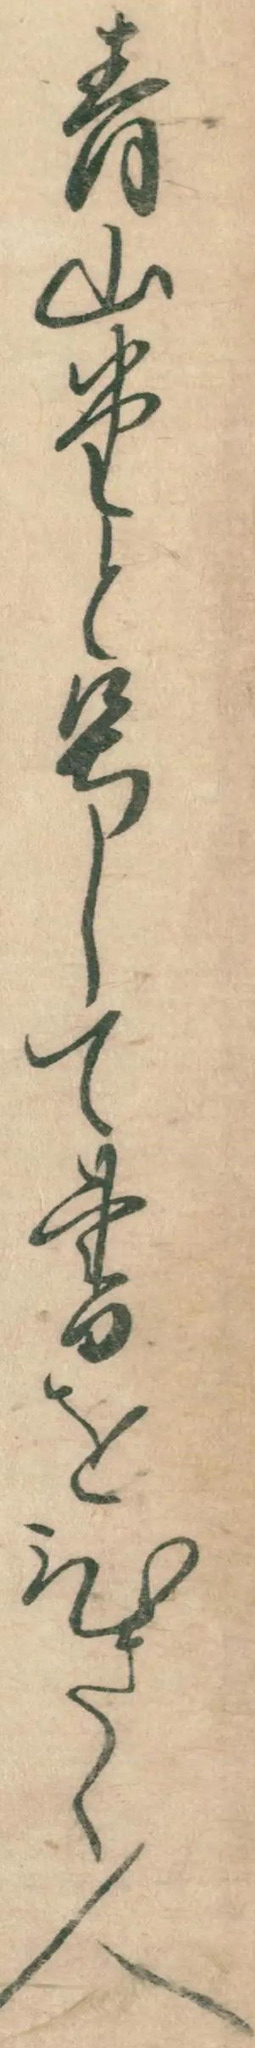青山堂と号して書をひさく人
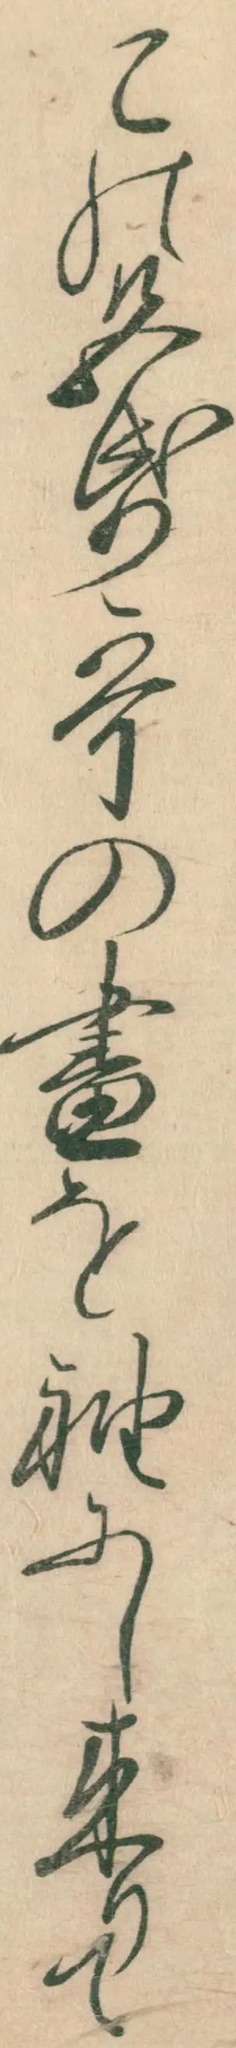この色紙歌の書を袖にし来りて
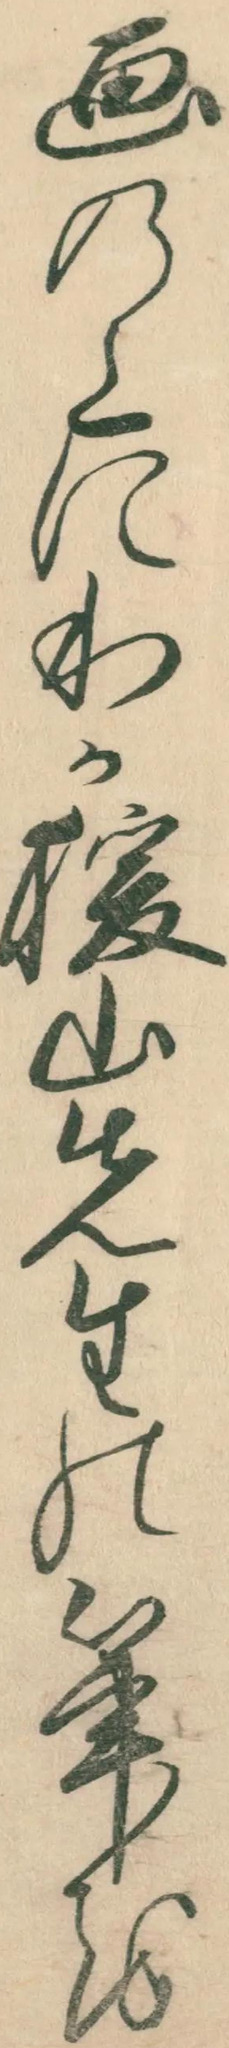画の上にわか猨山先生の筆を
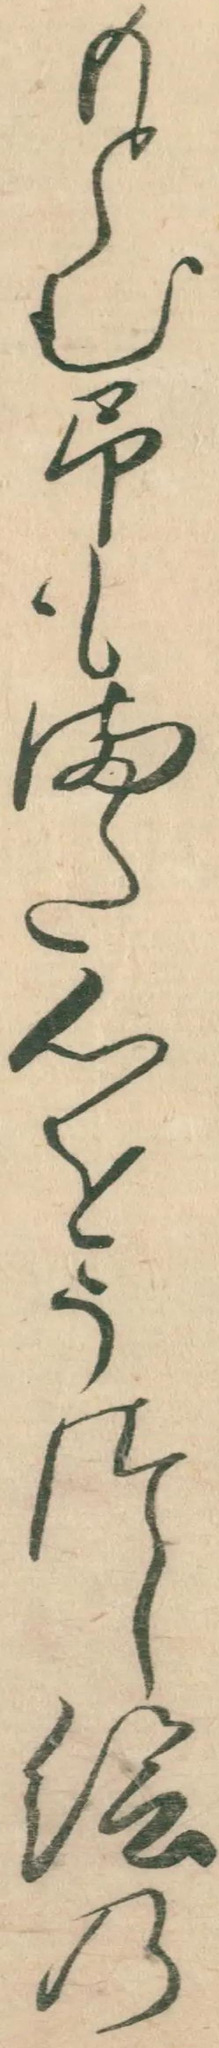もとむ予もまた心をうつし絵の
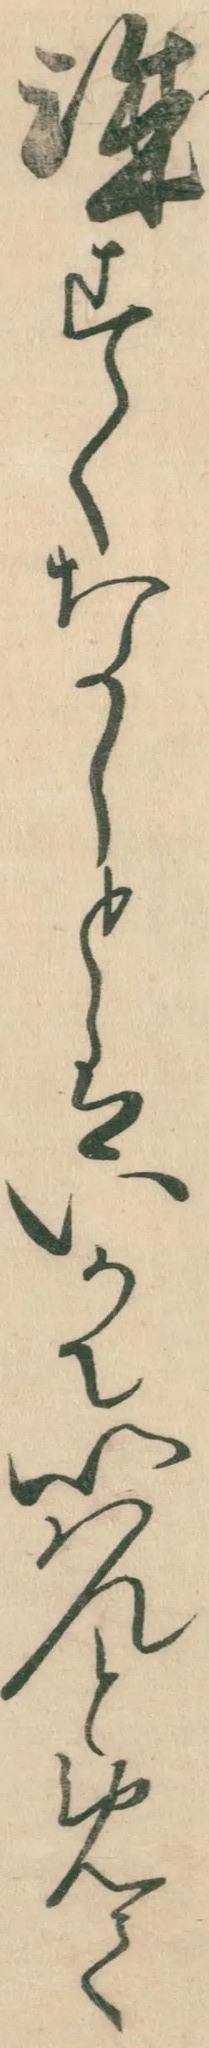誠すくなしとはいかにいはんとめて
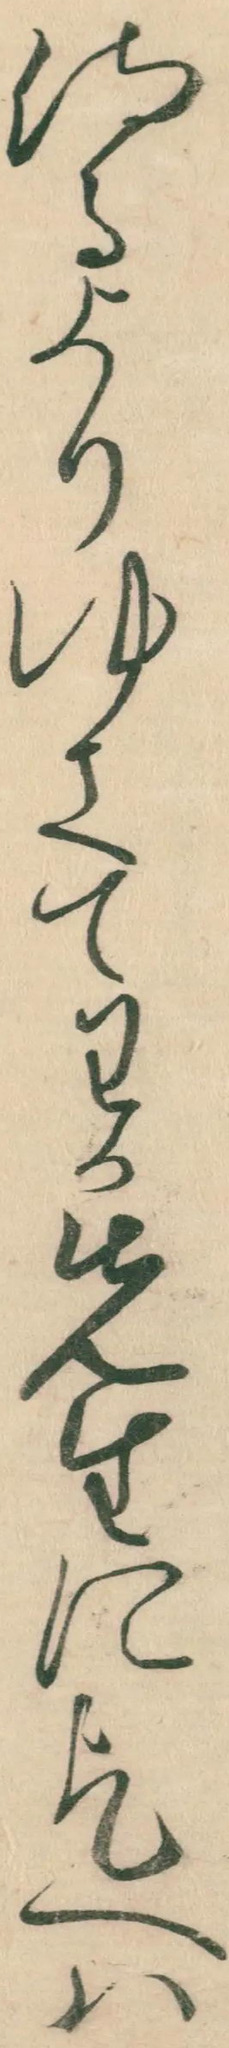侍るよりゆきてわか先生に乞へハ
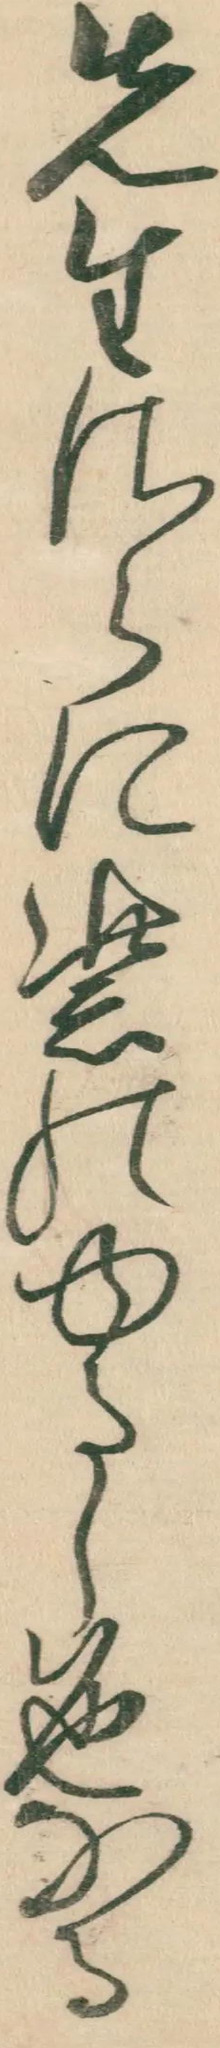先生さらに紫のゆるし色なる
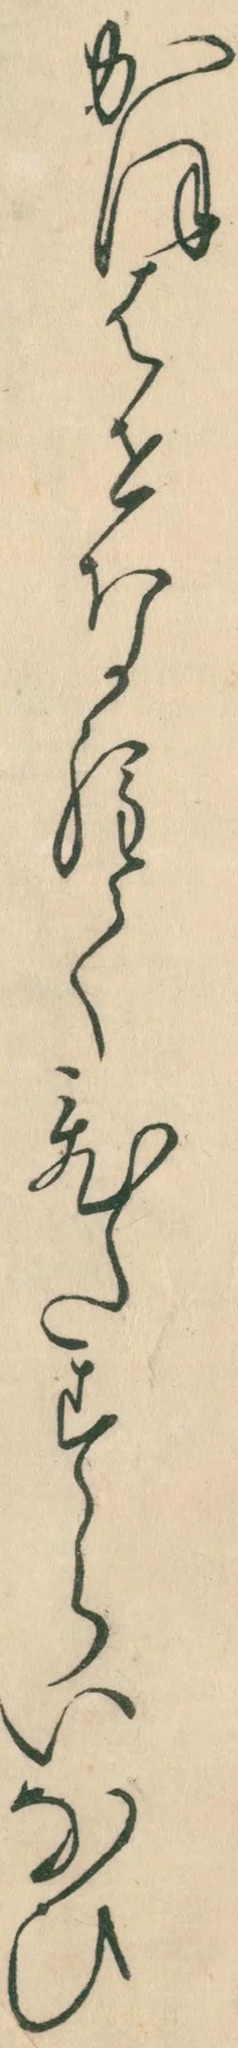かほはせならてひたすらいなひ
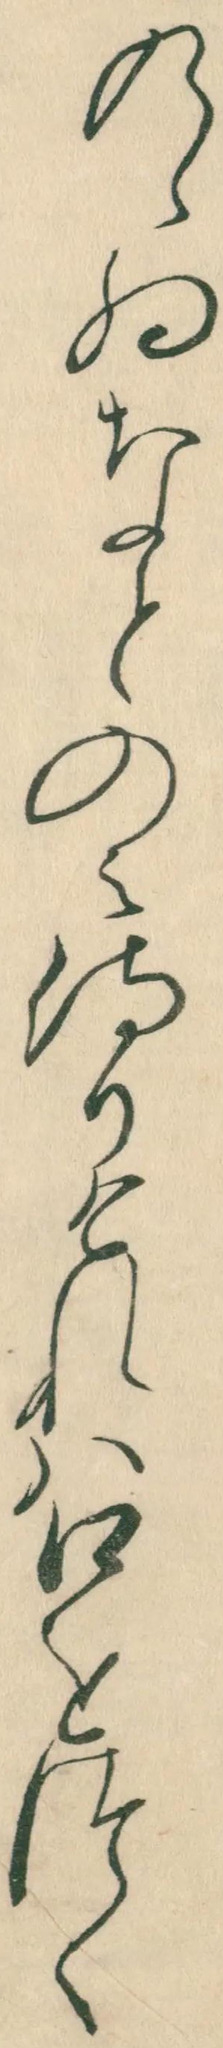のゝゐなとのえ侍りけれは口をつく
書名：錦百人一首あつま織
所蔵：国立国会図書館 National Diet Library, JAPAN
